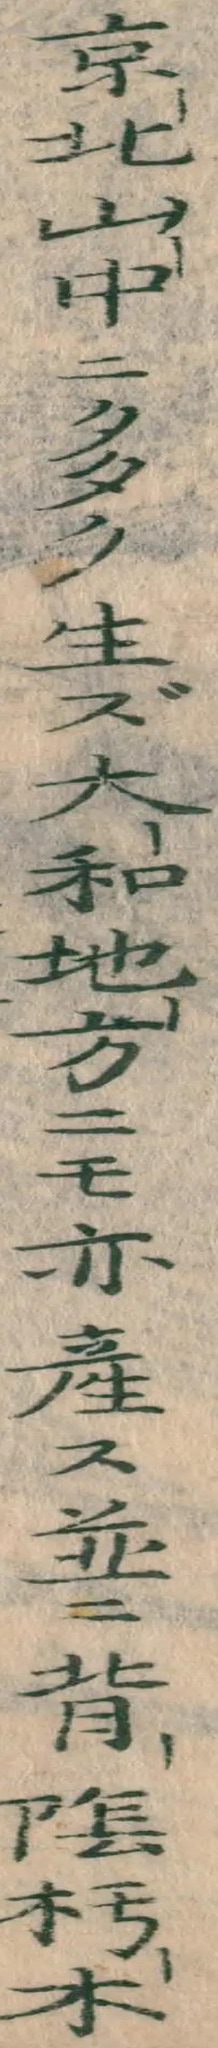京-北山-中ニ多ク生ズ大-和地-方ニモ亦産ス並ニ背-陰朽-木
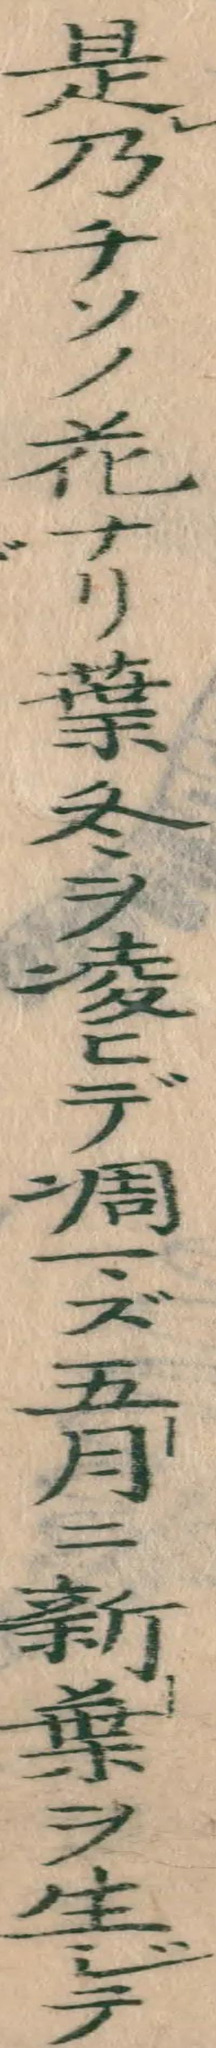是乃チソノ花ナリ葉冬ヲ凌ヒデ凋マズ五-月ニ新-葉ヲ生ジテ
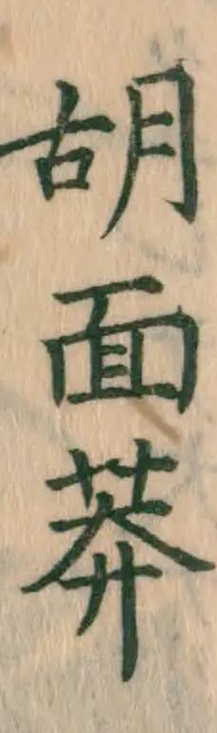胡面莽

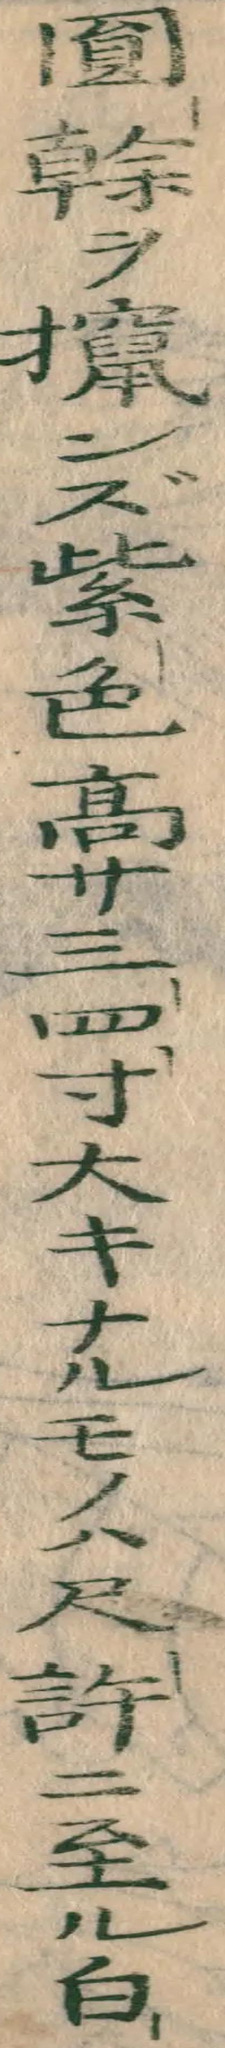円-幹ヲ攛ンズ紫-色高サ三-四-寸大キナルモノハ尺-許ニ至ル白-
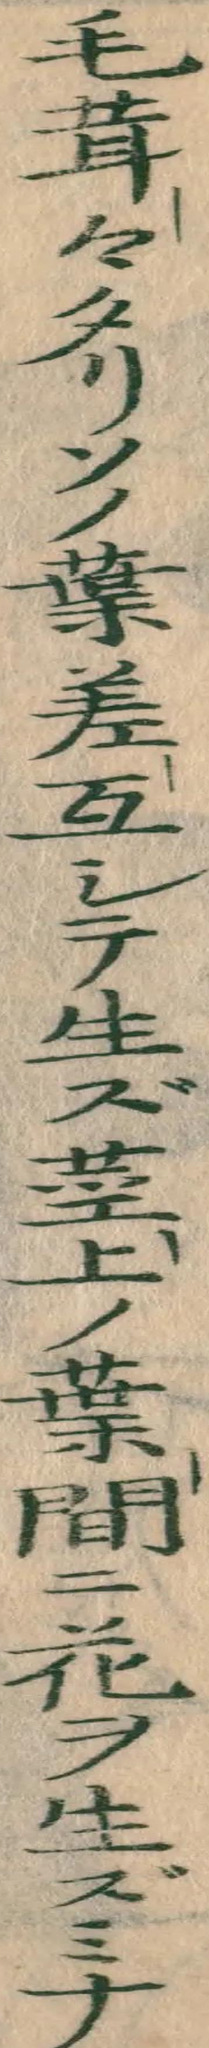毛茸-々タリソノ葉差-互シテ生ズ茎-上ノ葉-間ニ花ヲ生ズミナ
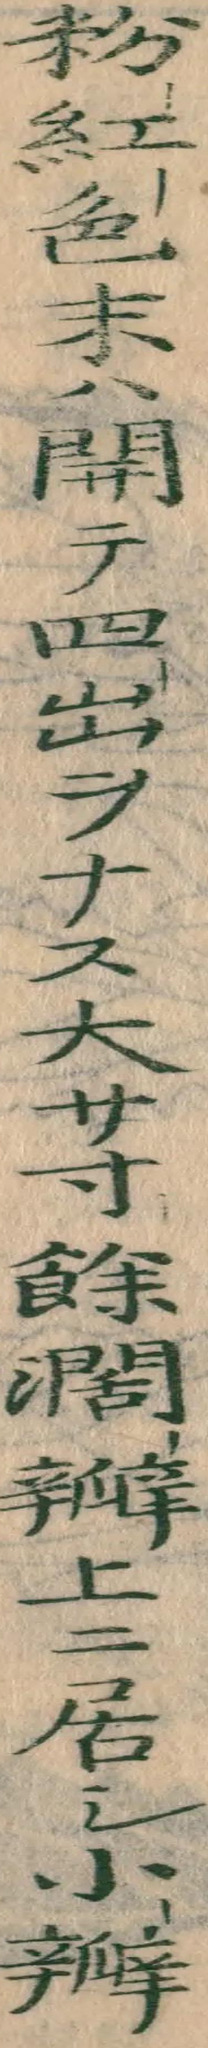粉-紅-色末ハ開テ四-出ヲナス大サ寸-余闊-弁上ニ居シ小-弁
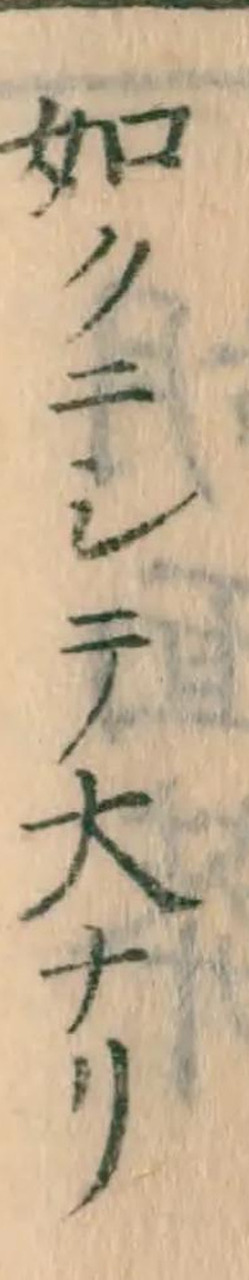如クニシテ大ナリ
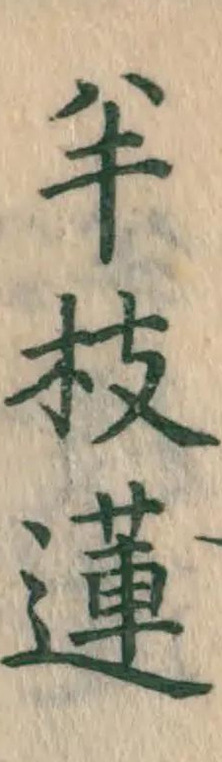半枝蓮

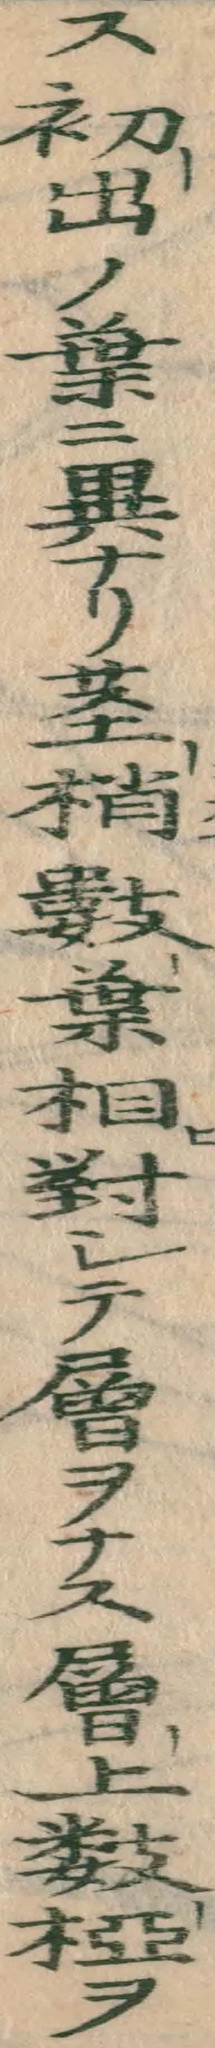ス初-出ノ葉ニ異ナリ茎-梢数-葉相対シテ層ヲナス層-上数-椏ヲ
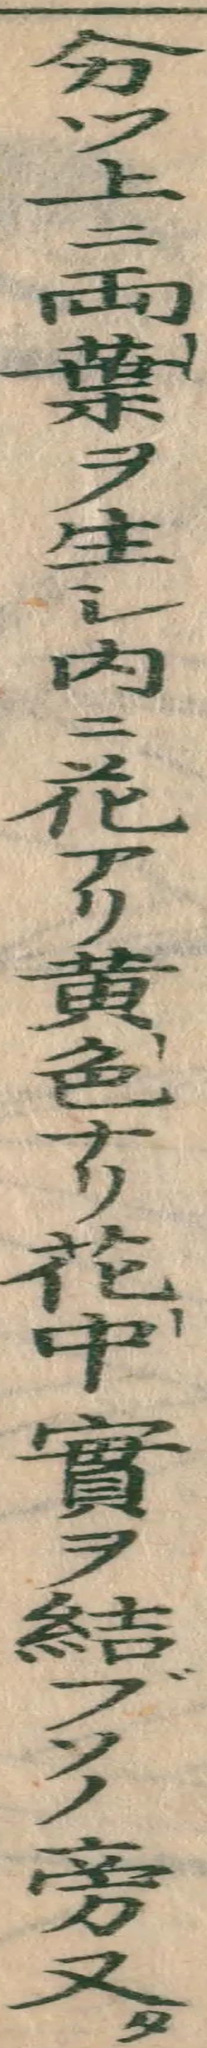分ツ上ニ両-葉ヲ生シ内ニ花アリ黄-色ナリ花-中実ヲ結ブソノ旁又
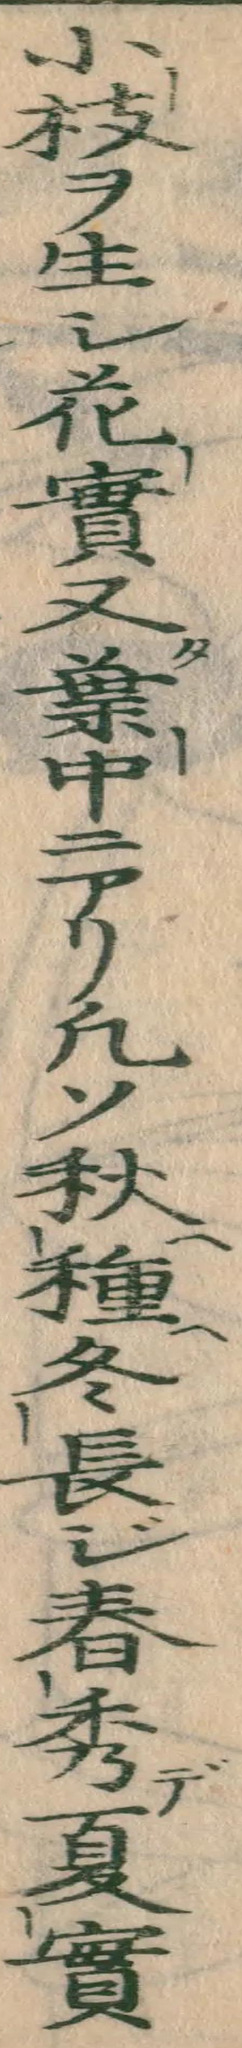小-枝ヲ生シ花-実又葉-中ニアリ凡ソ秋-種冬-長ジ春-秀夏-実
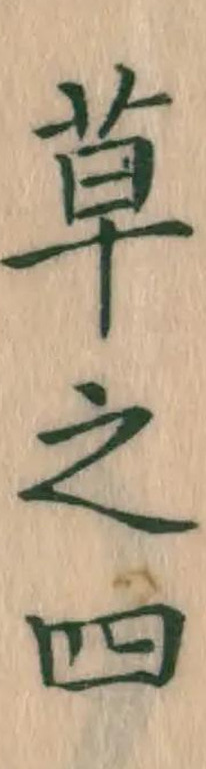草之四
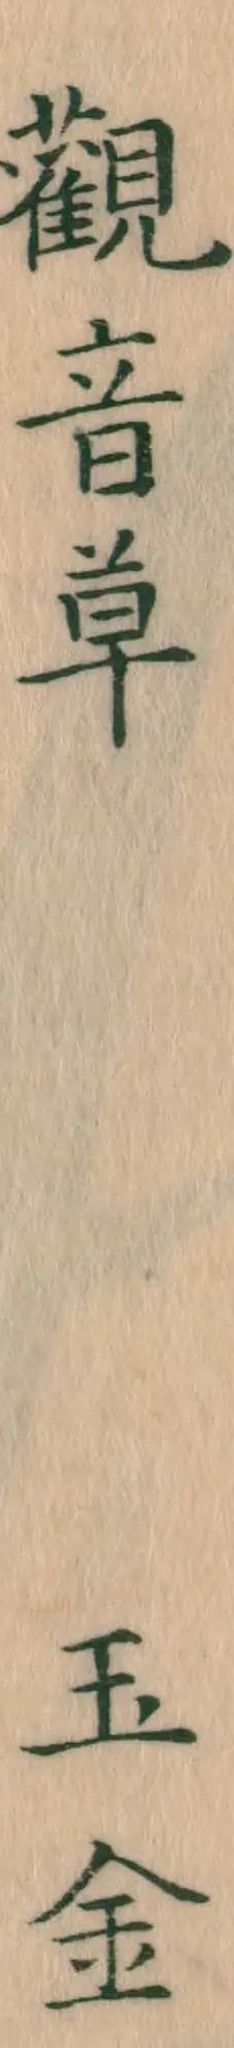観音草玉金
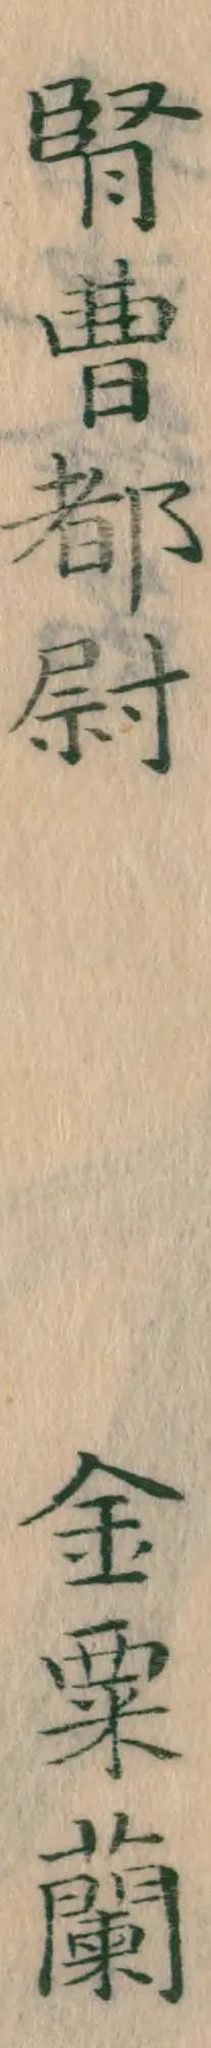腎曹都尉金粟蘭
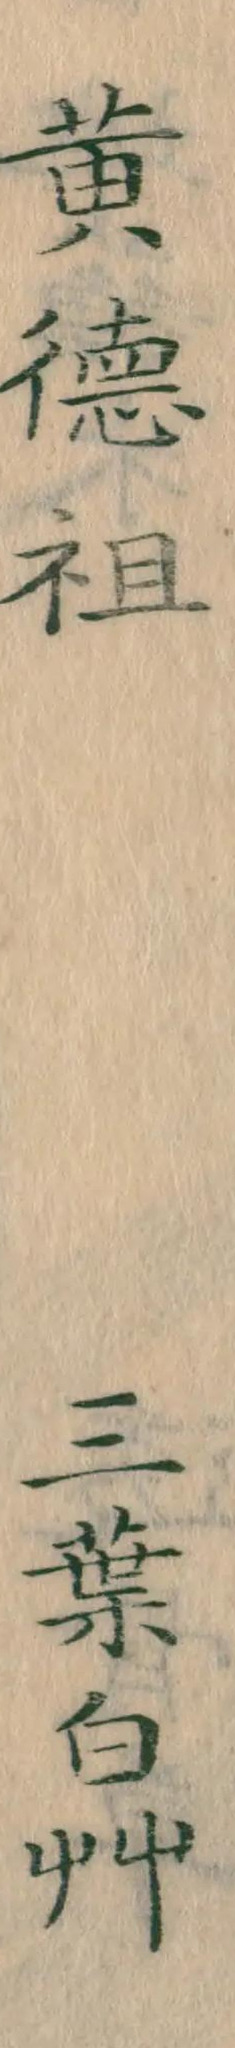黄徳祖三葉白艸

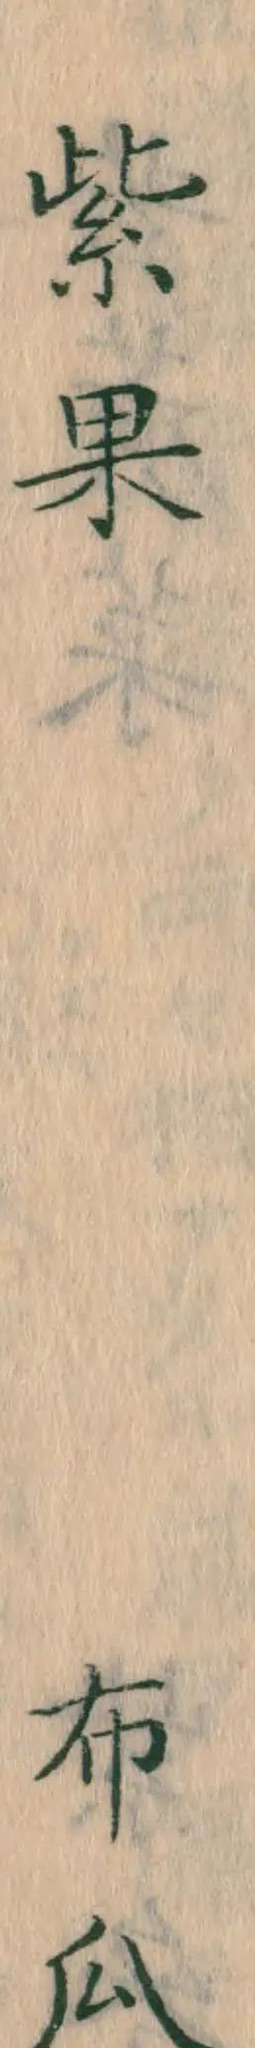紫果布瓜
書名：花彙 草部4巻木部4巻. [1]
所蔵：国立国会図書館 National Diet Library, JAPAN
